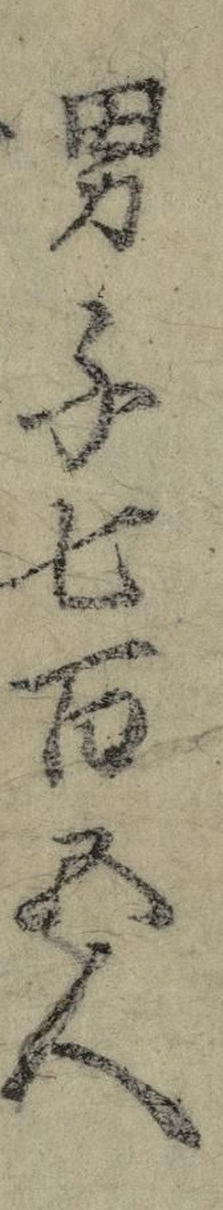内男千七百五人
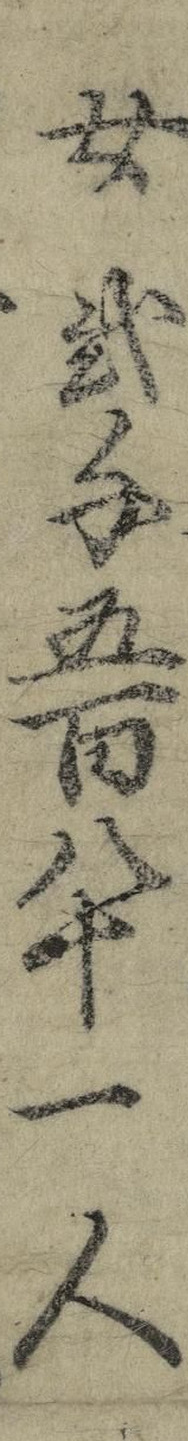女弐千五百八十一人
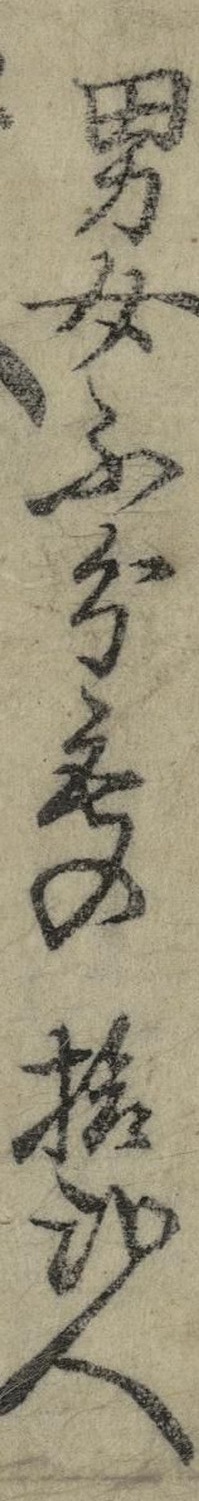男女不分もの拾弐人
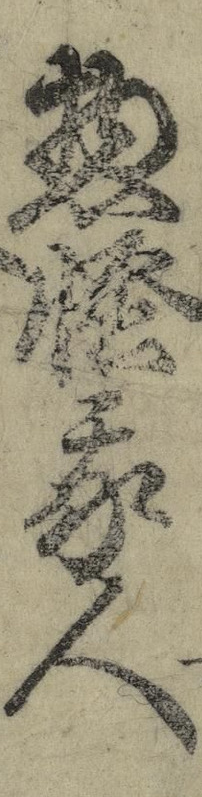惣怪我人
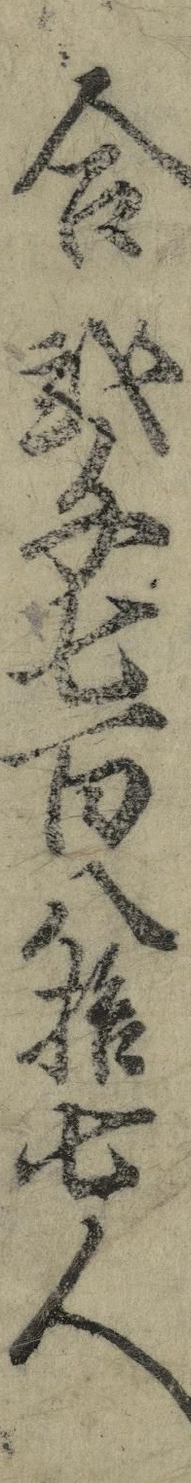合弐千七百八拾七人
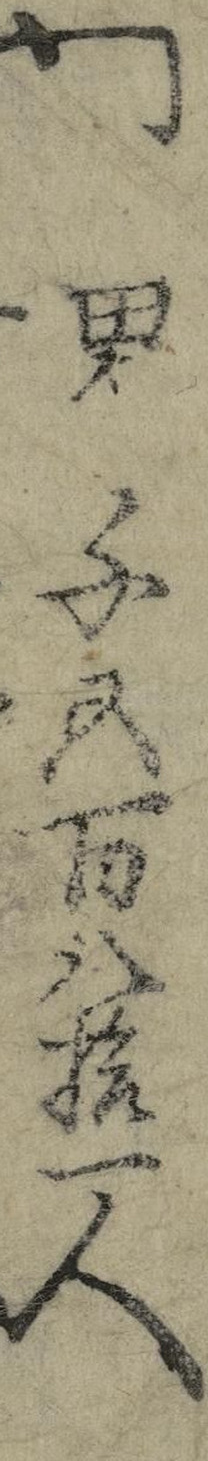内男千五百八拾一人
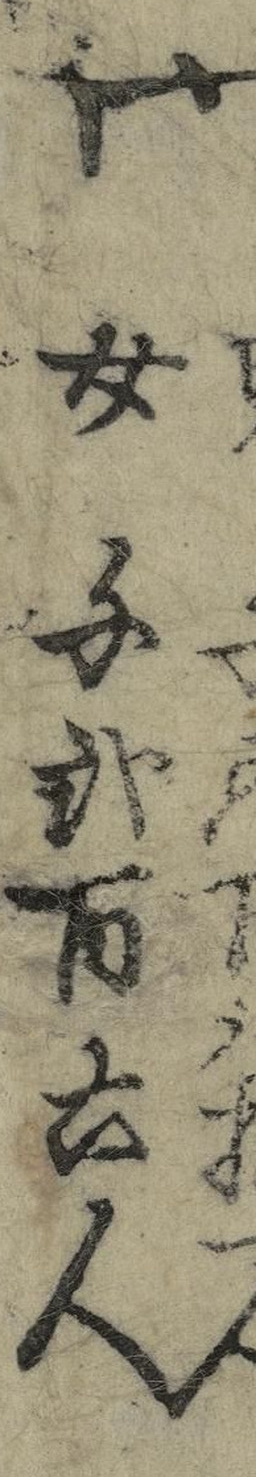女千弐百六人

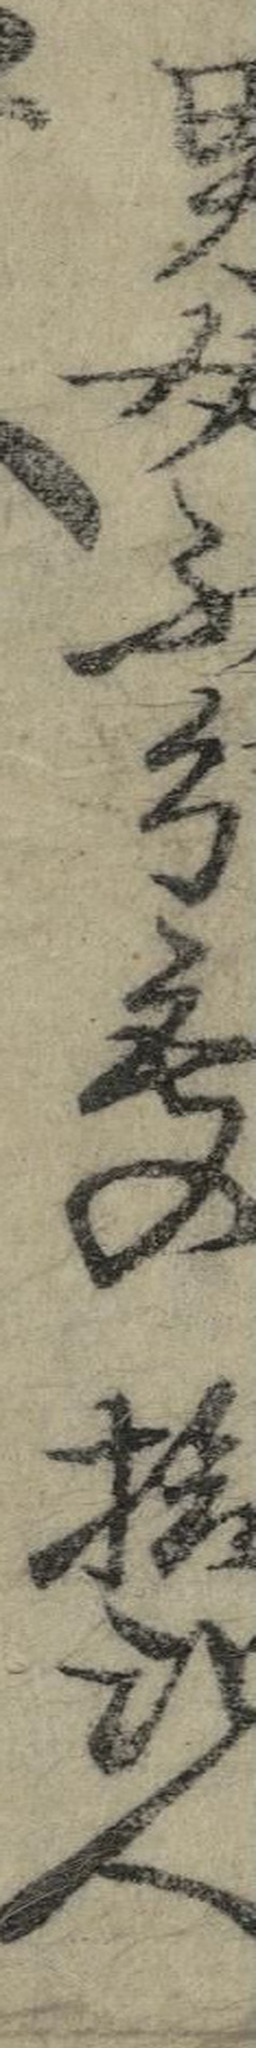男女不分もの拾弐人
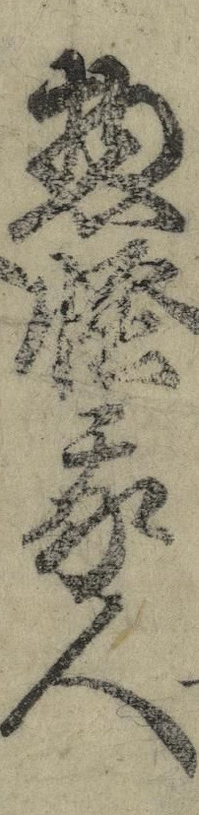惣怪我人
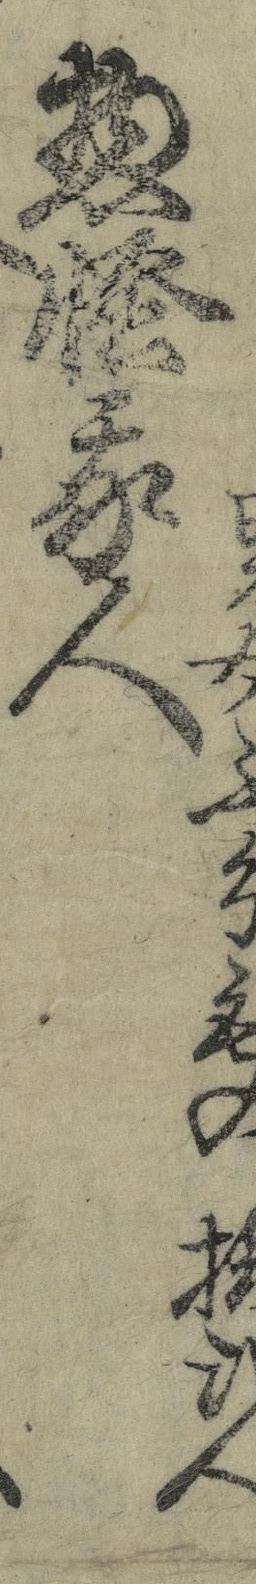惣怪我人
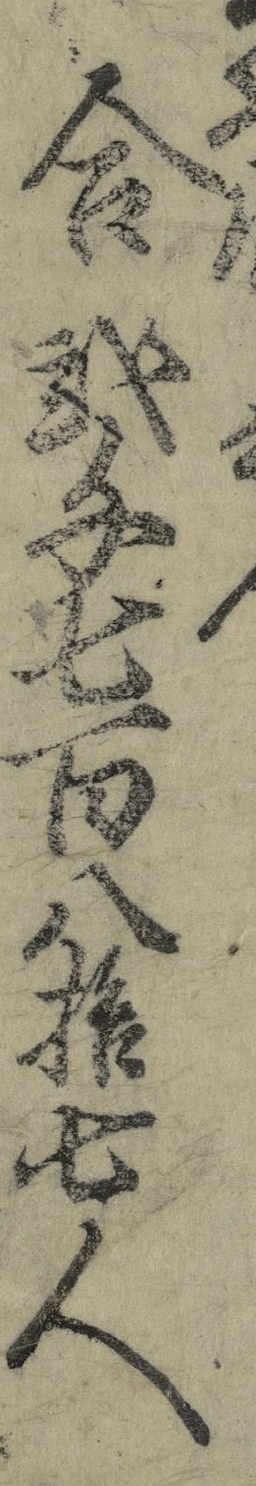合弐千七百八拾七人
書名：地震出火　男女死人怪我人書上之冩
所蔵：東京大学地震研究所図書室 Earthquake Research Institute Library, The University of Tokyo, JAPAN
